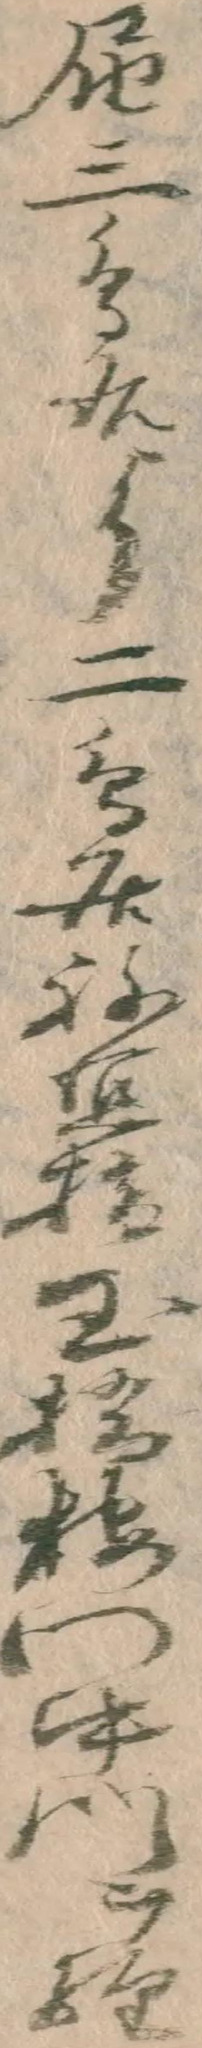届三鳥居より二鳥居祢宜橋玉橋楼門中門ヲ経
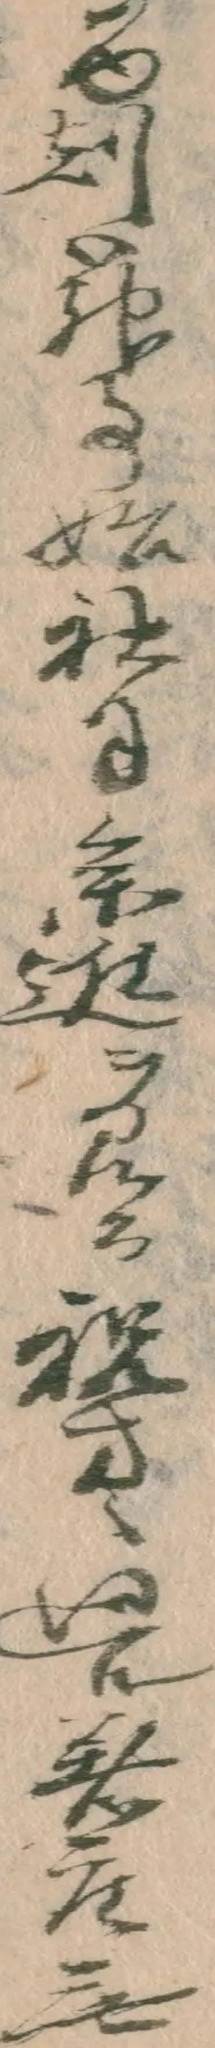酉刻御神事始社司参進ヲ見而祝方へ廻ル着座無
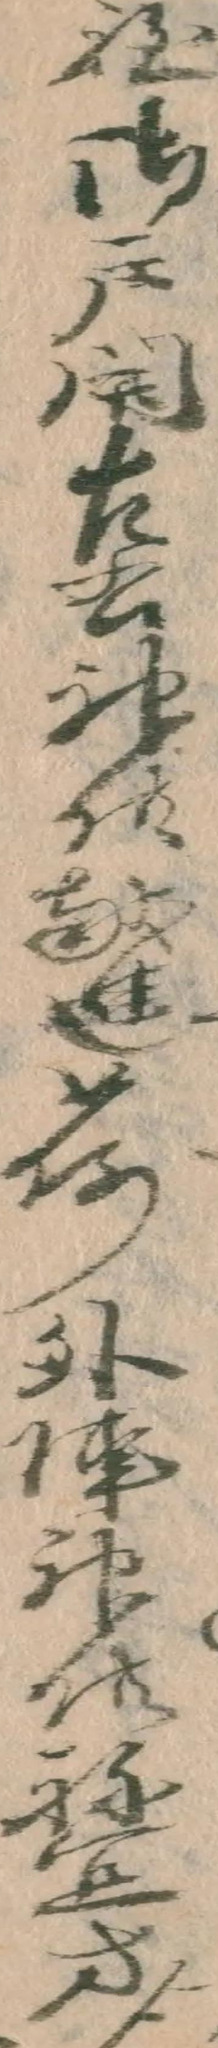程御戸開左右神供献進如何外陣神供祢宜方ゟ
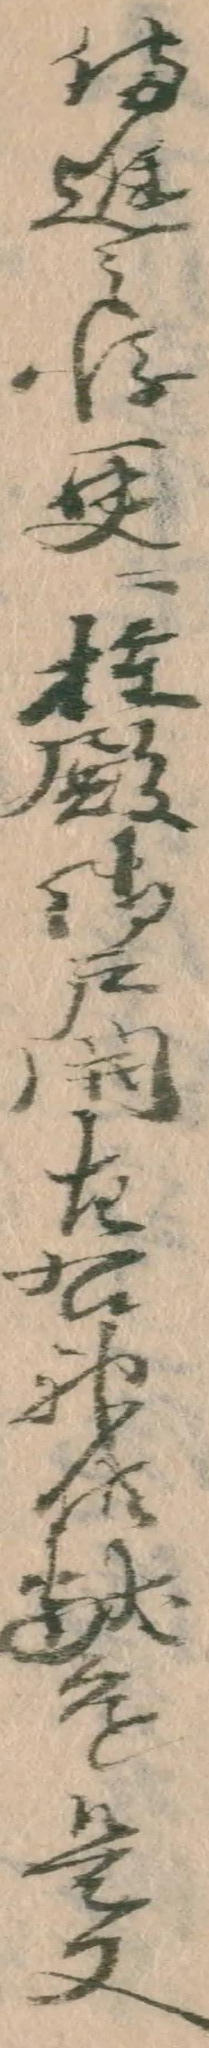備進之後更ニ柱殿御戸開左右神供献進是又
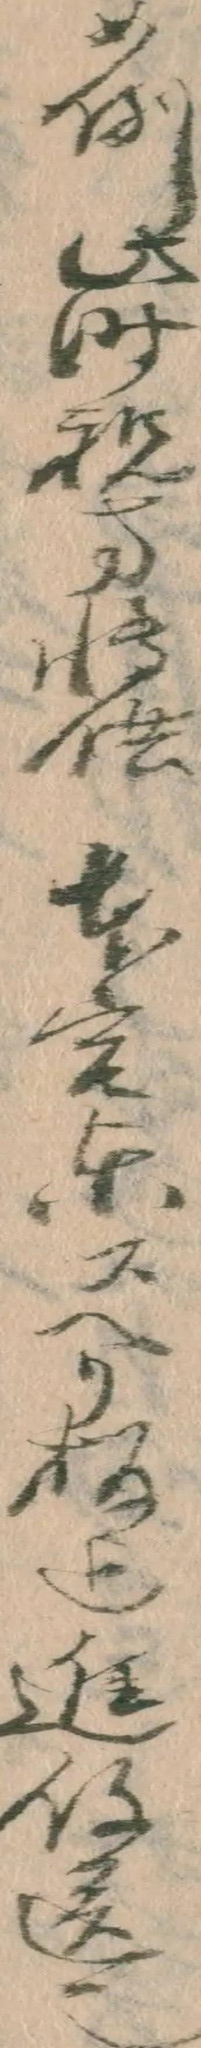如例此時祝方轉供本宮東スへリ板迄進役送也
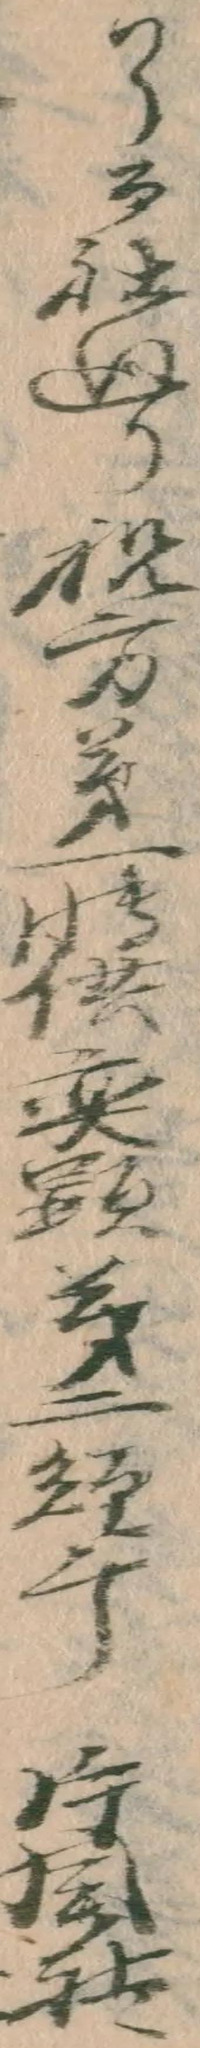了而社廻り祝方第一轉供奕顕第二経千片岡社へ
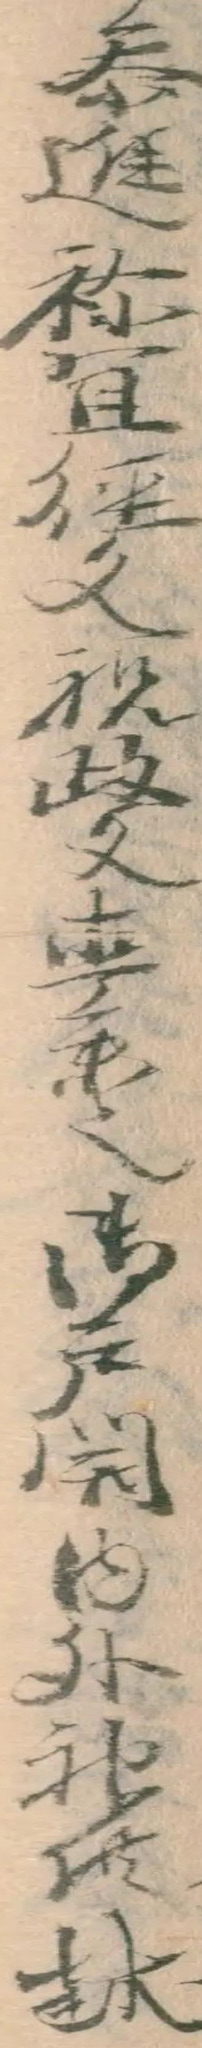参進祢宜経久祝政又直参也御戸開内外神供献
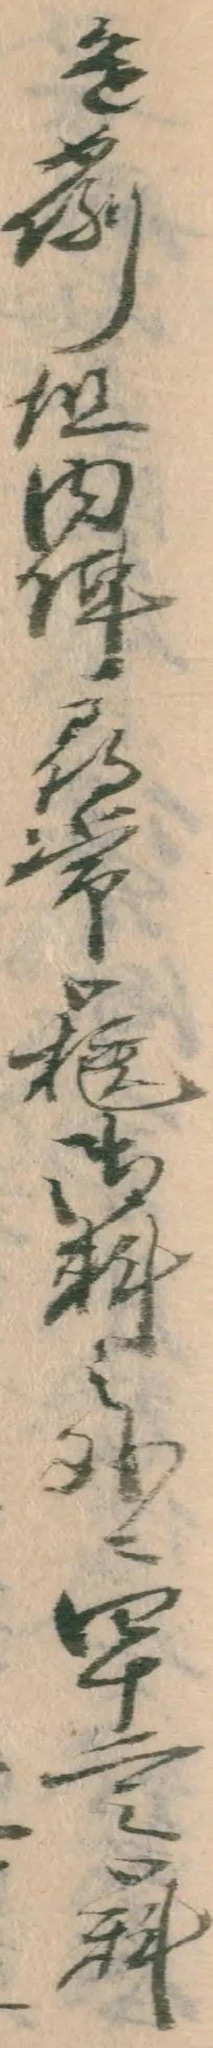進如例但内陣尋常御櫃御料之外ニ四十二之御料
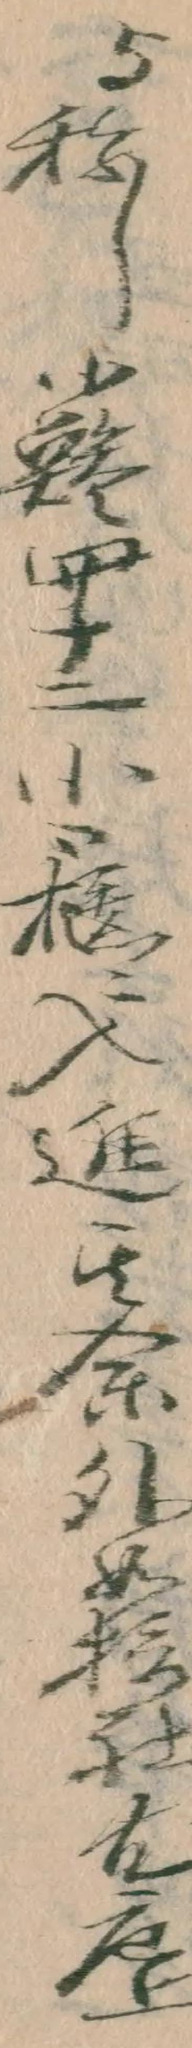と称し小鯵四十二小御櫃ニ入進其余外如摂社尤庭上
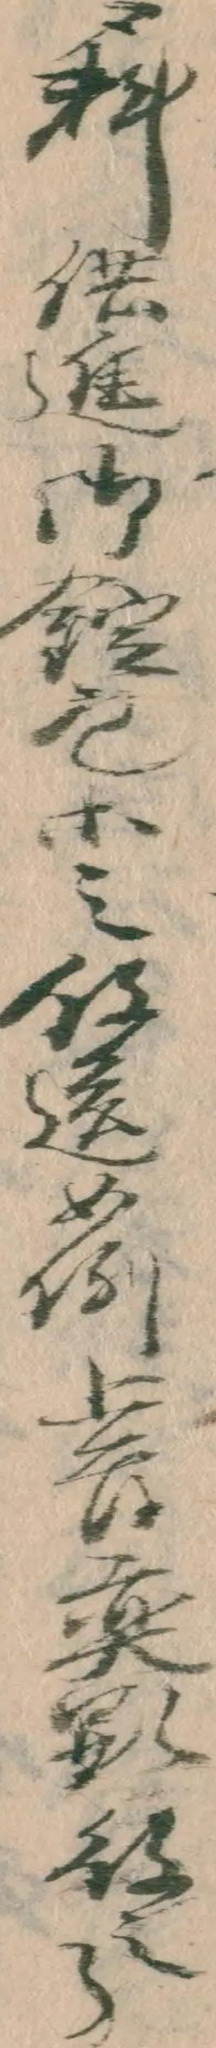御料供進御錠包等之役送如例上首奕顕役之了
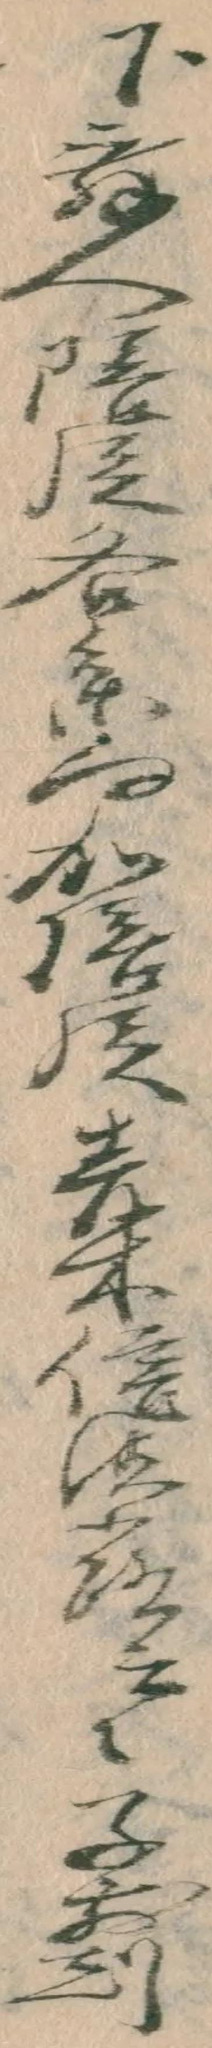下舞人陪従各参向加陪従青木信濃小路云々子前刻
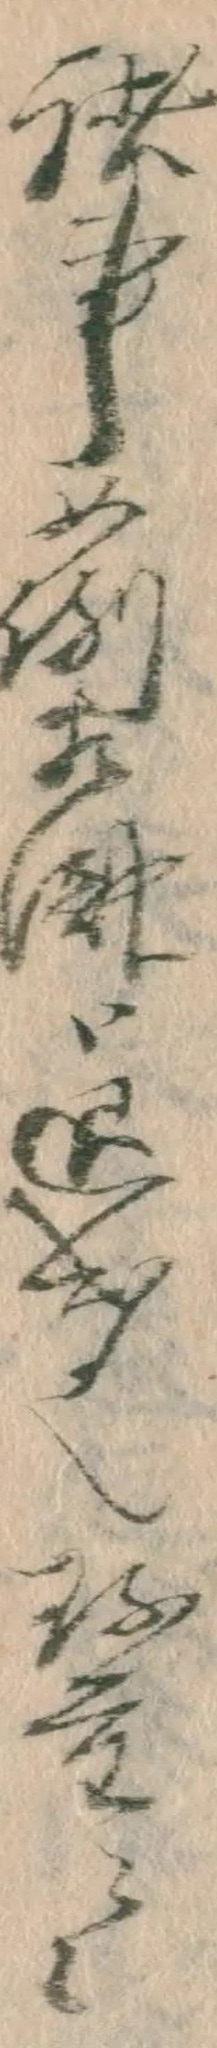諸事如例相済御退出也珍重々々
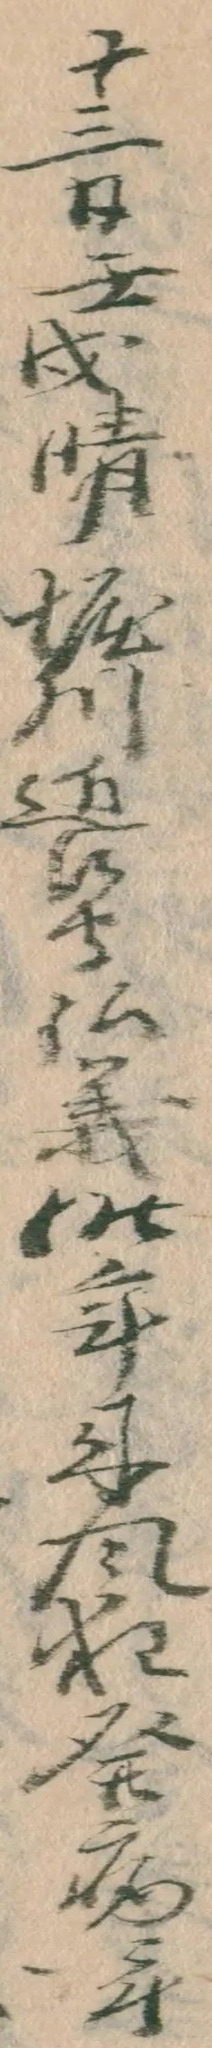十三日壬戌晴堀川近江守仏義昨年来風狂発病ニ付
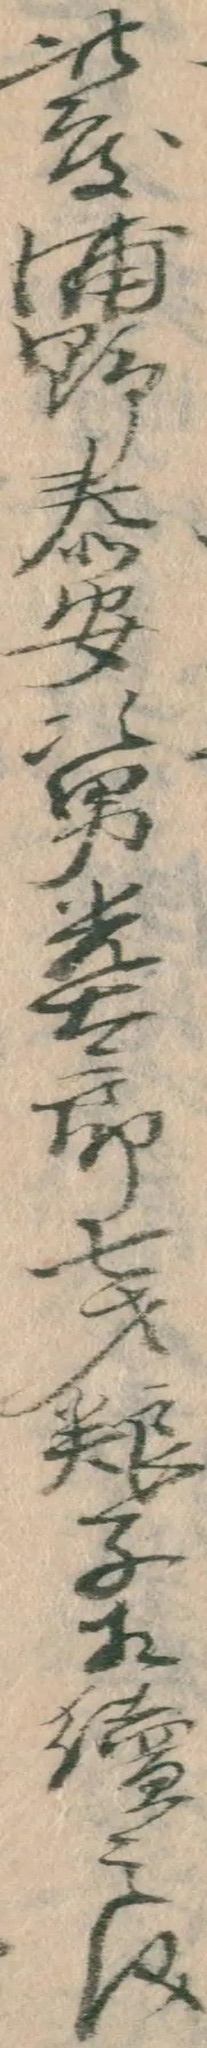此度浦野泰安次男光太郎七才養子相続之儀
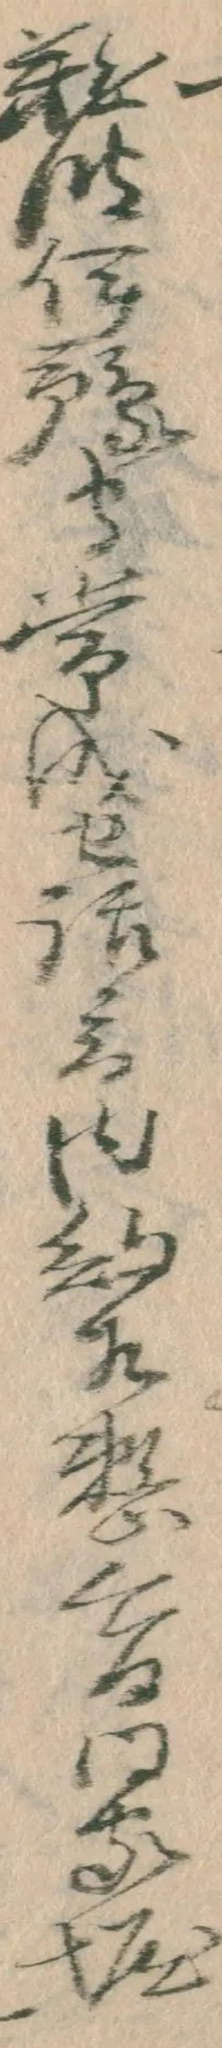難波伊豫守常成世話ニ而内約相整今日同家堀
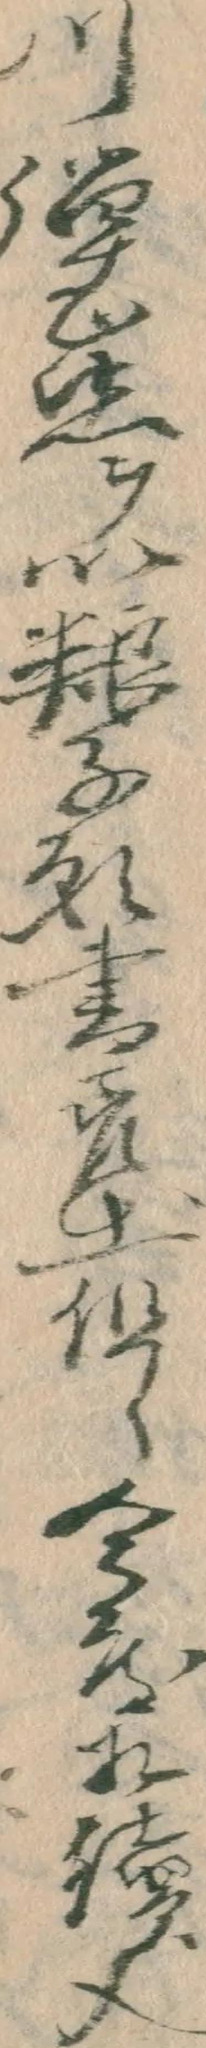川弾正忠を以粮子願書差出候但し今度相續入
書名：賀茂社記録. 第67冊
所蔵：国立国会図書館 National Diet Library, JAPAN
